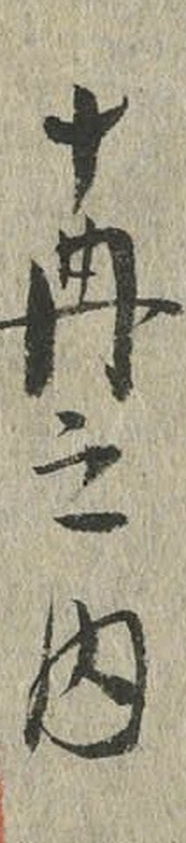十冊之内
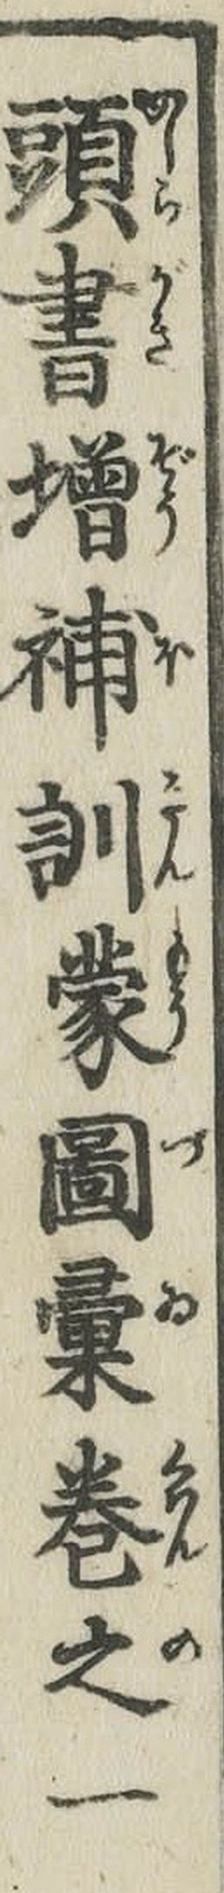頭書増補訓蒙図彙巻之一
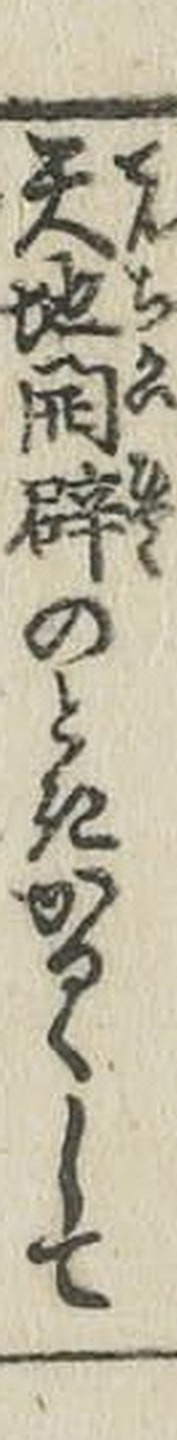天地開辟のときかるくして
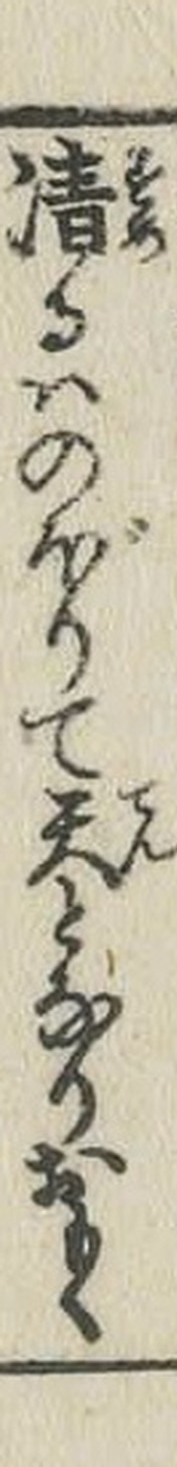清るはのぼりて天となりおもく
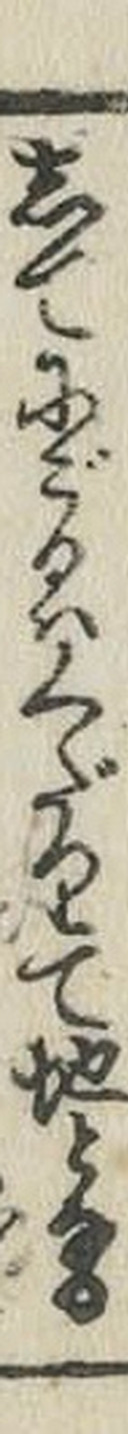してにごるはくだりて地となる
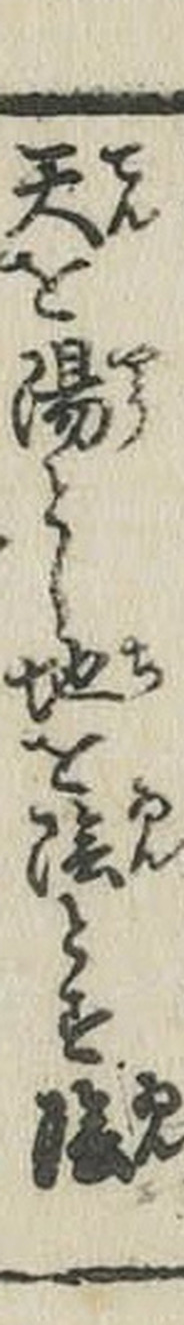天を陽とし地を陰とす陰
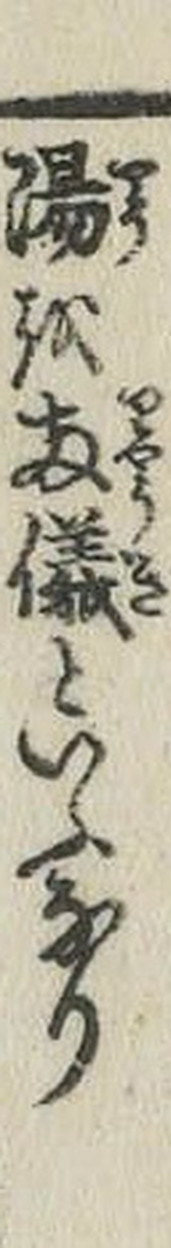陽を両儀といふなり
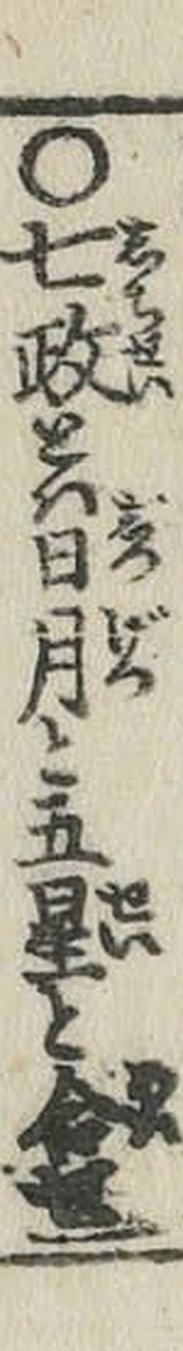○七政とは日月と五星を合せ
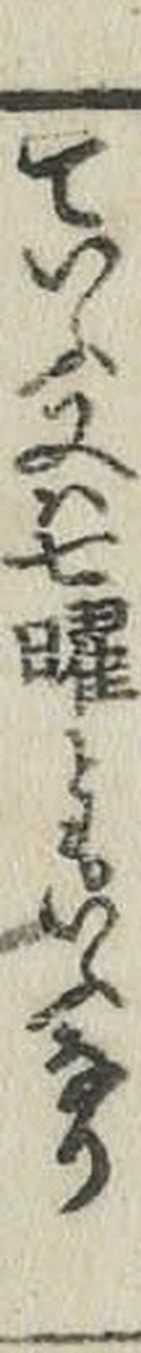ていふ又は七曜ともいふなり
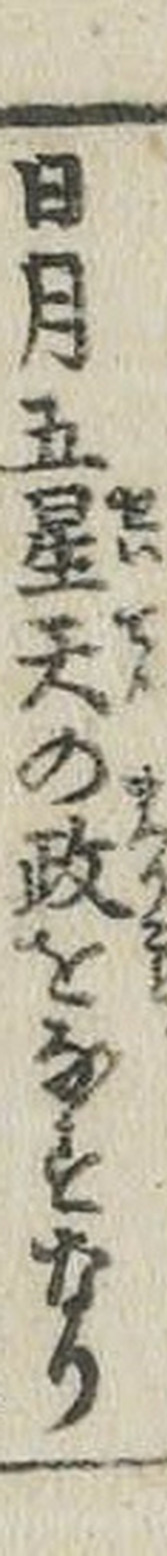日月五星天の政をなすなり
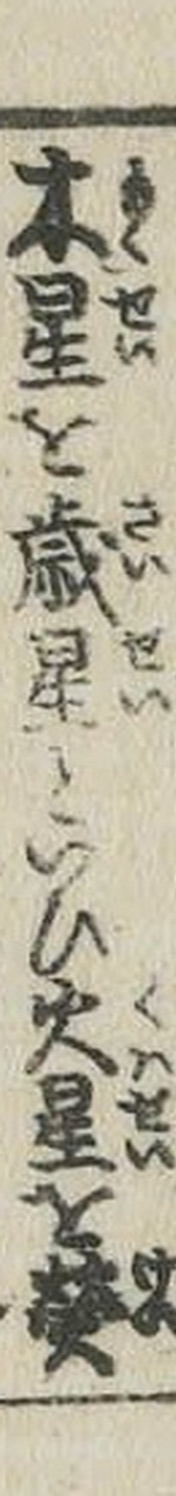木星を歳星といひ火星を熒
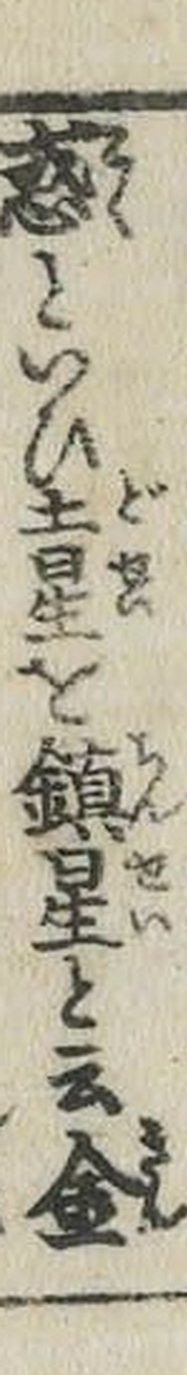惑といひ土星を鎮星と云金
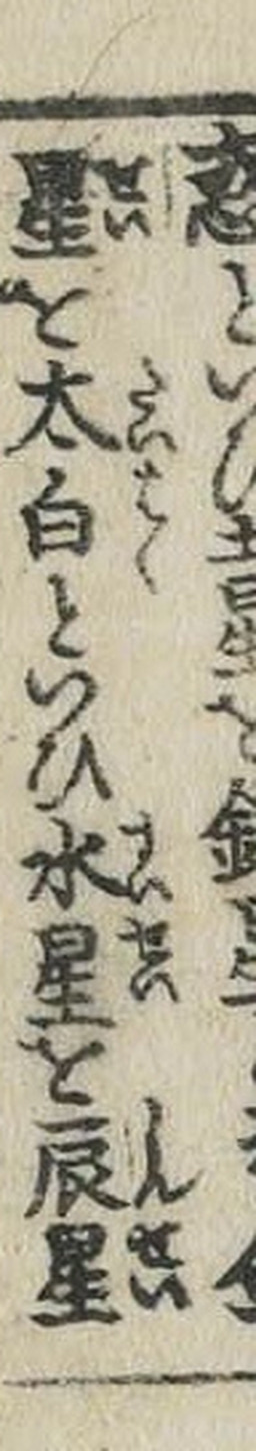星を太白といひ水星を辰星

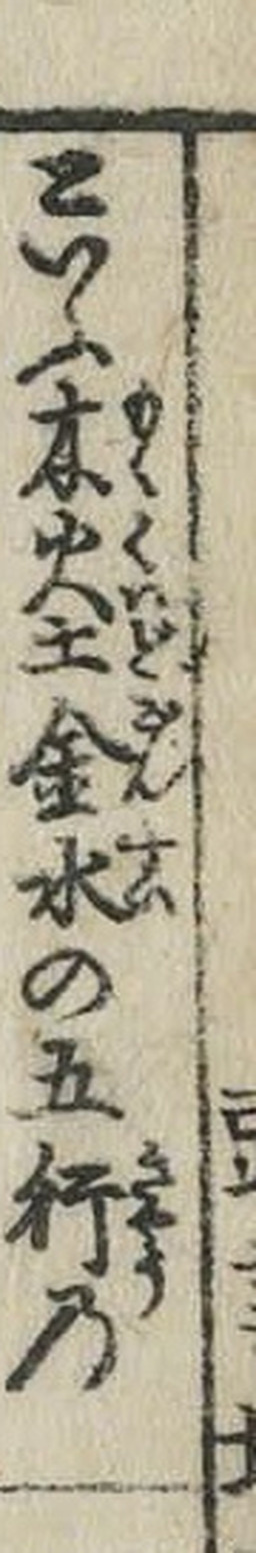といふ木火土金水の五行の
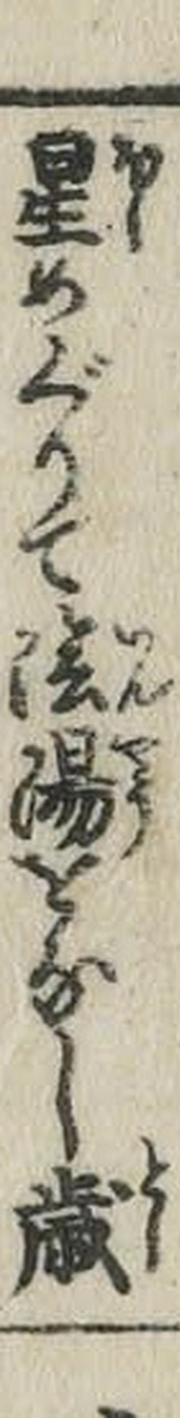星めぐりて陰陽をなし歳
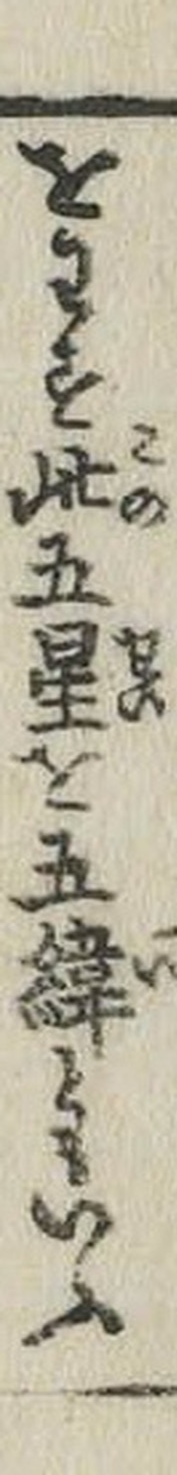をわす此五星を五緯ともいふ
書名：増補頭書訓蒙図彙大成 10巻 2:巻之1-3
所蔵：東京学芸大学教育コンテンツアーカイブ
